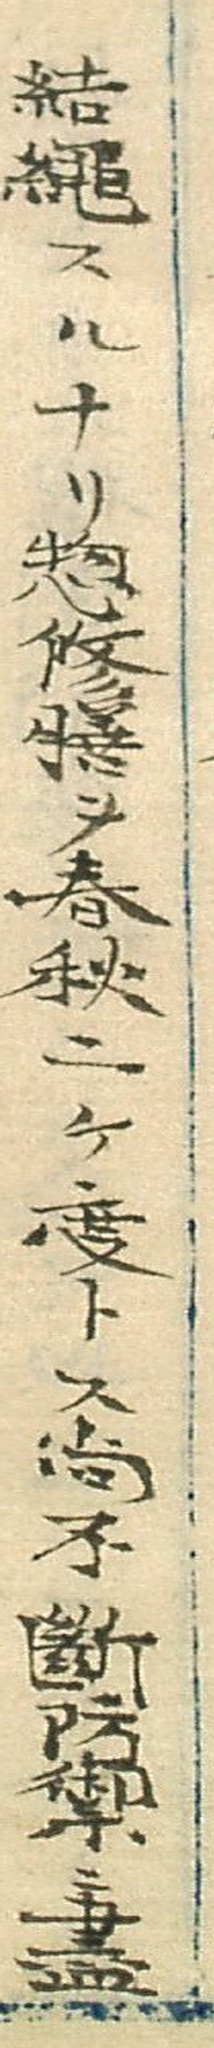結縄スルナリ惣修膳ヲ春秋二ヶ度トス尚不断防禦ニ尽
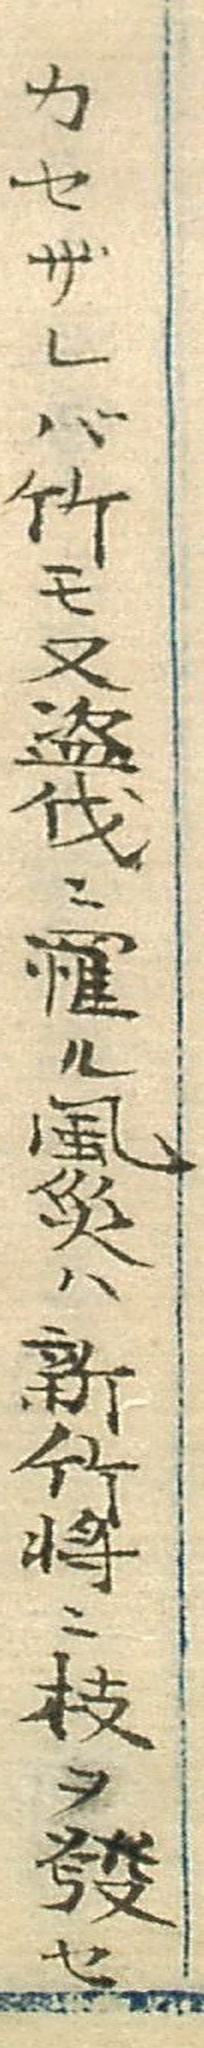力セザレバ竹モ又盗伐ニ罹ル風災ハ新竹将ニ枝ヲ発セ
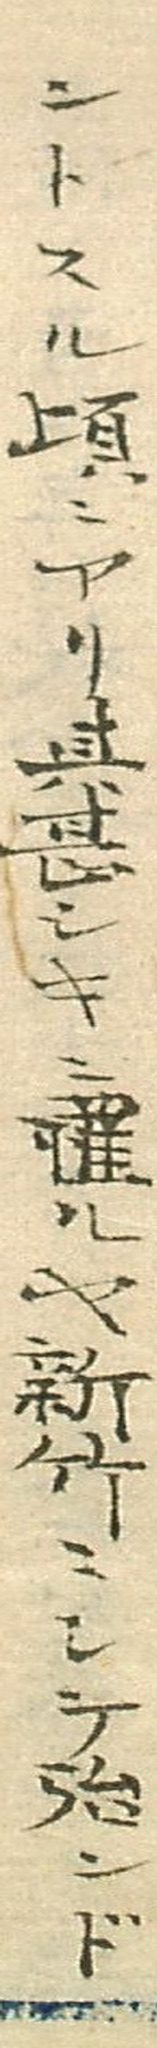ントスル頃ニアリ其甚シキニ罹ルヤ新竹ニシテ殆ンド
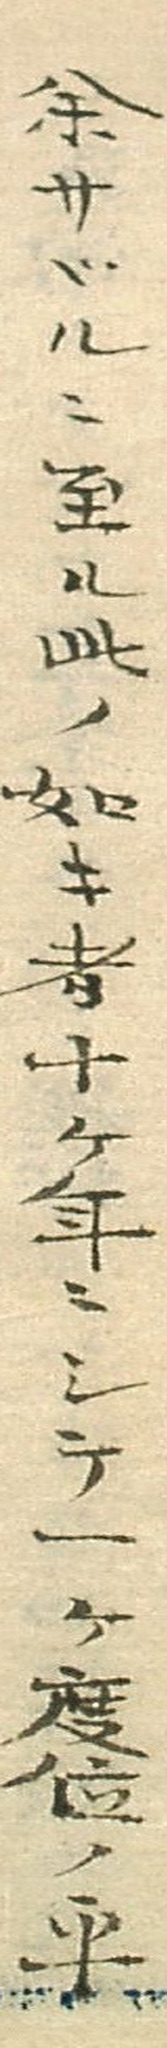余サヾルニ至ル此ノ如キ者十ヶ年ニシテ一ヶ度位ノ平
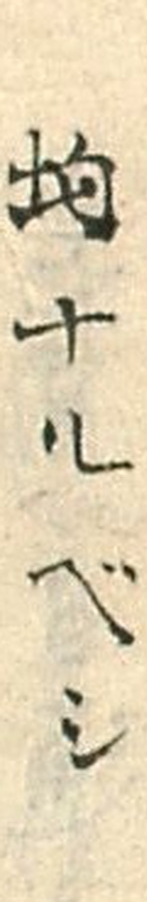均ナルベシ
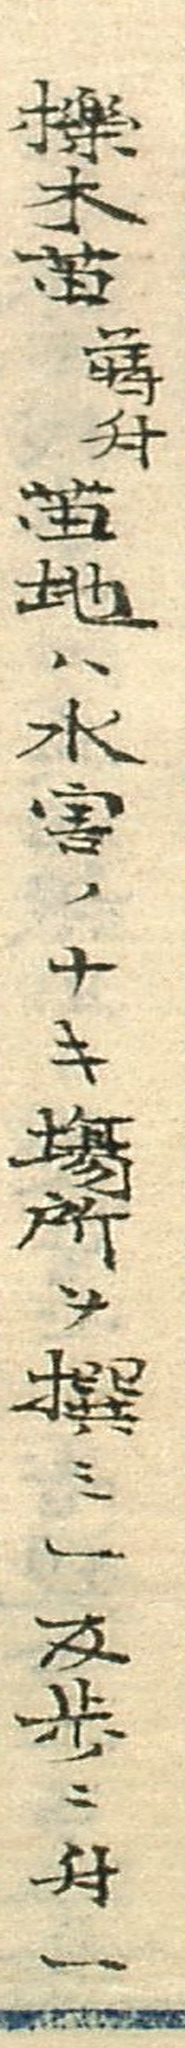櫟木苗蒔付苗地ハ水害ノナキ場所ヲ撰ミ一反歩ニ付一
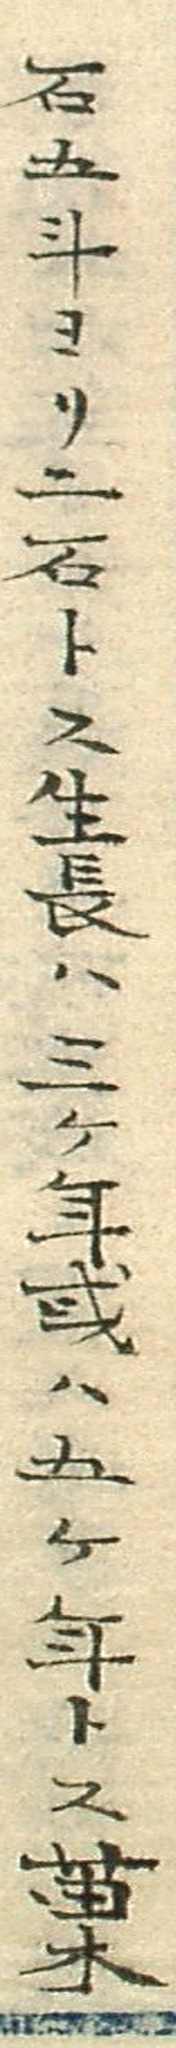石五斗ヨリ二石トス生長ハ三ヶ年或ハ五ヶ年トス苗木
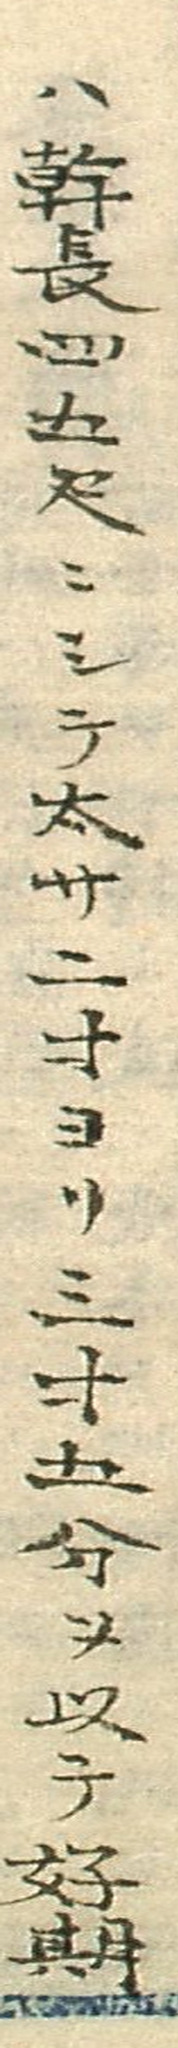ハ幹長四五尺ニシテ太サ二寸ヨリ三寸五分ヲ以テ好期
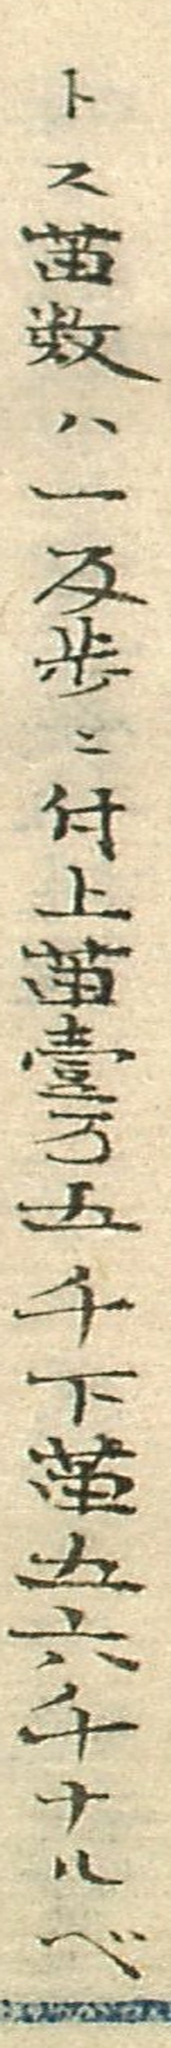トス苗数ハ一反歩ニ付上苗壱万五千下苗五六千ナルベ
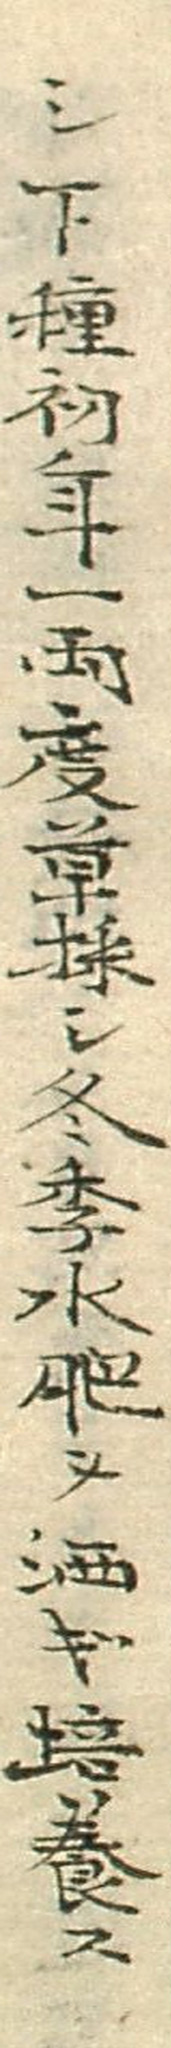シ下種初年一両度草採シ冬季水肥ヲ洒ギ培養ス
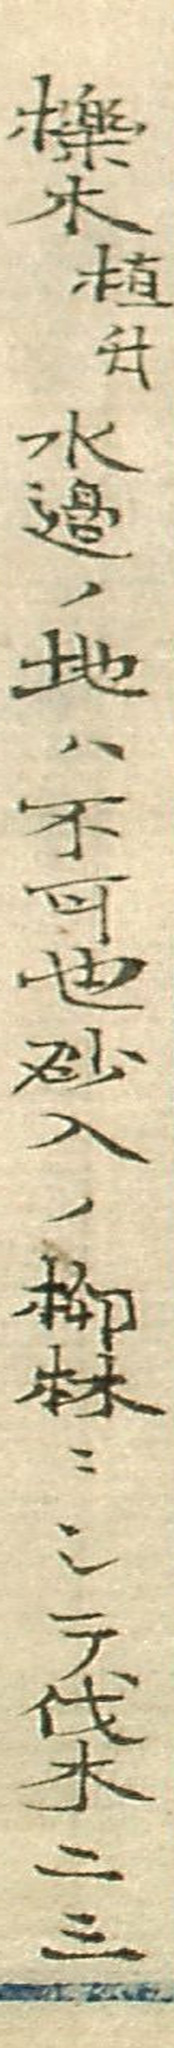櫟木植付水辺ノ地ハ不可也砂入ノ柳林ニシテ伐木二三
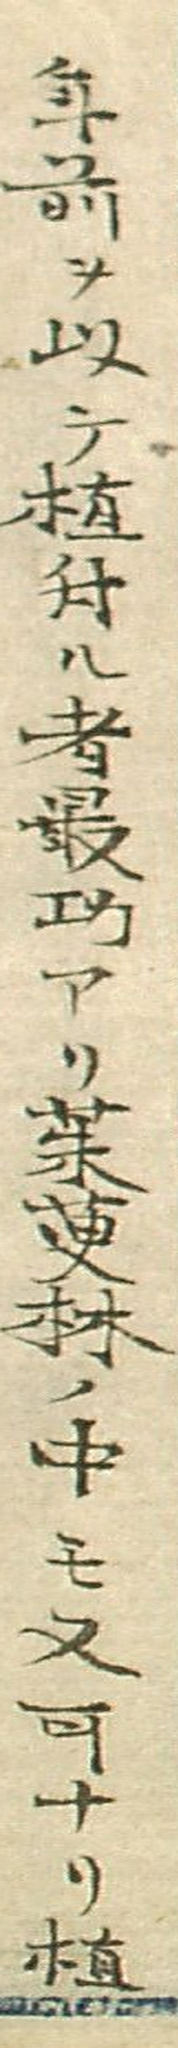年前ヲ以テ植付ル者最功アリ茱萸林ノ中モ又可ナリ植
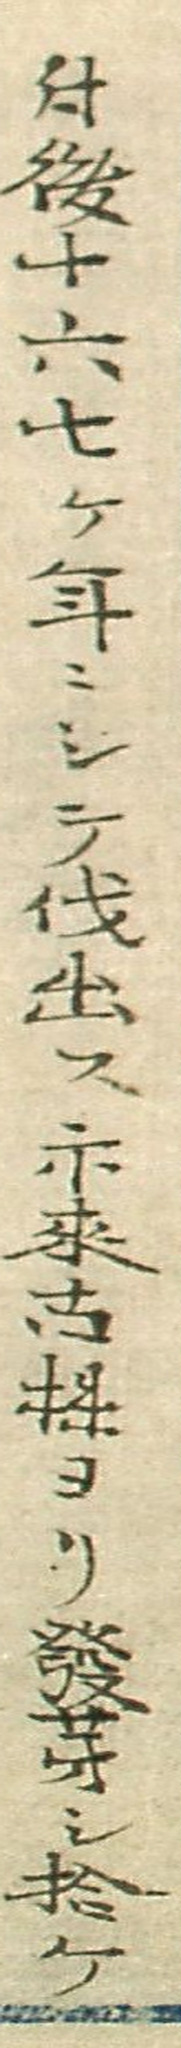付後十六七ヶ年ニシテ伐出ス示来古株ヨリ発芽シ拾ヶ
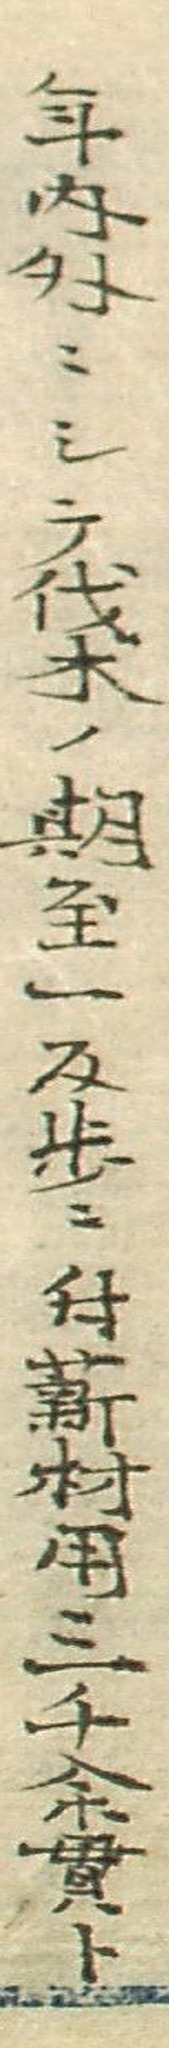年内外ニシテ伐木ノ期至一反歩ニ付薪材用三千余貫ト

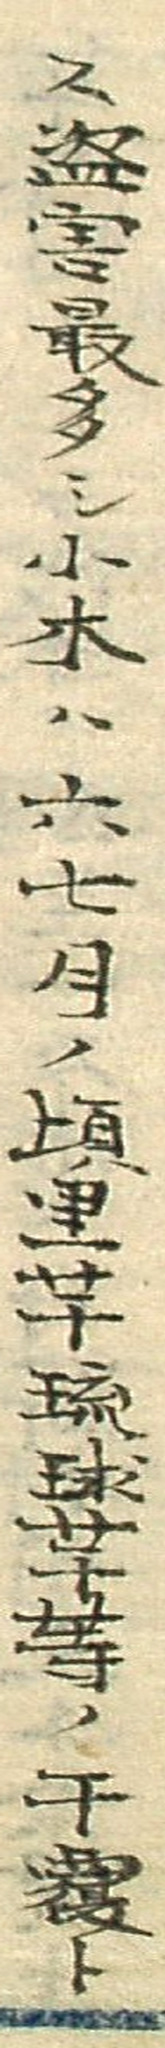ス盗害最多シ小木ハ六七月ノ頃里芋琉球芋等ノ干覆ト
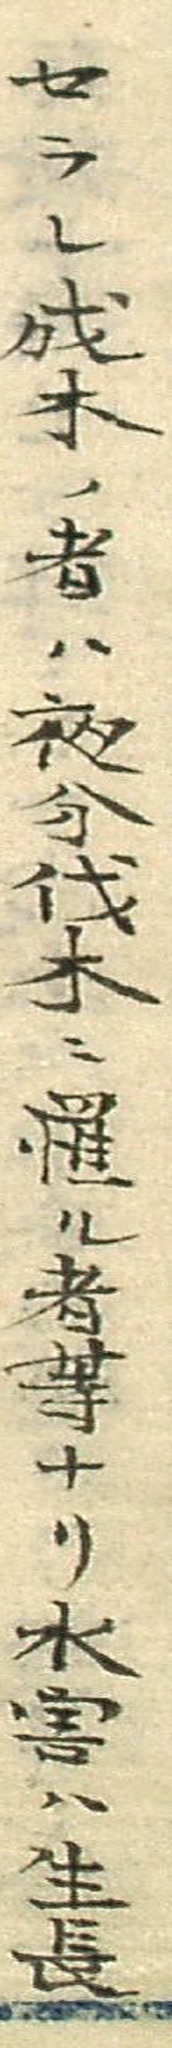セラレ成木ノ者ハ夜分伐木ニ罹ル者等ナリ水害ハ生長
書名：山林共進会取調書
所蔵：鳴門教育大学 Naruto University of Education
